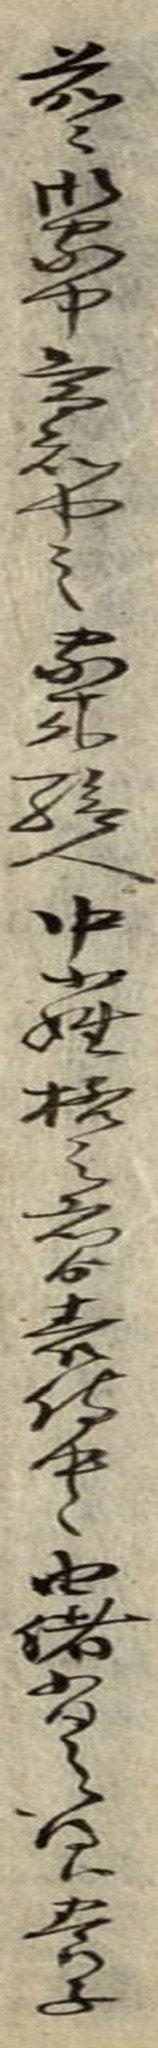前々御家中高知中之家来給人中小姓格之者ゟ表侍中へ由緒有之候得ハ養子
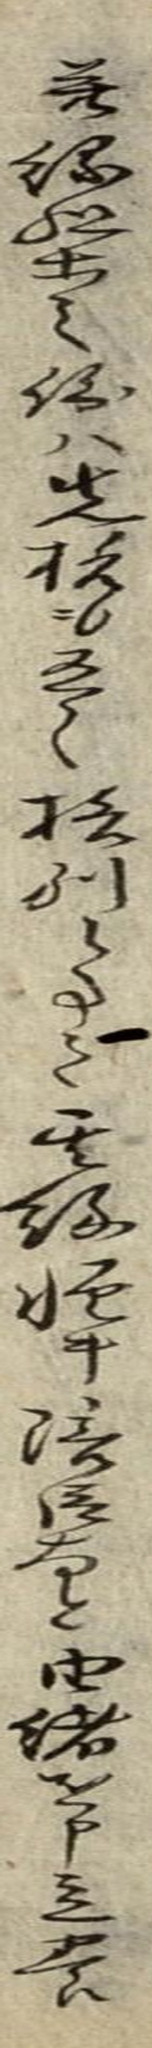并縁組等之儀ハ先格も有之格別之事ニ候其余軽キ陪臣なと由緒を申立養
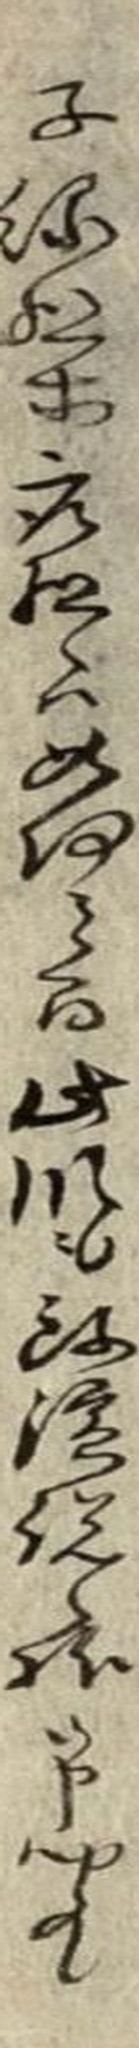子縁組等取組候ハ如何ニ候間此段も致演説候様被申聞候
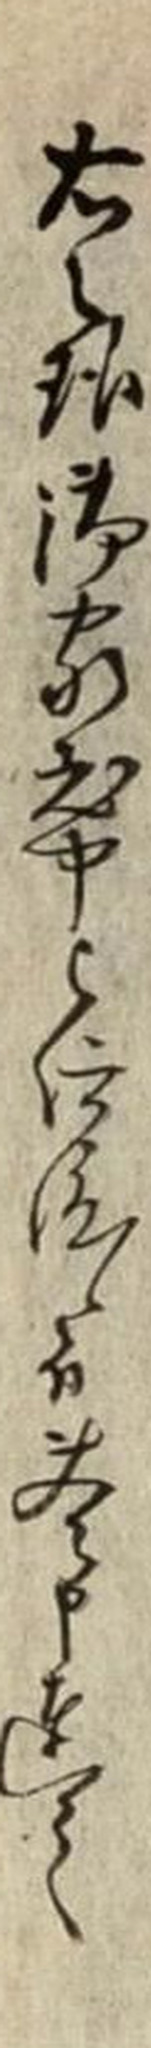右之趣御家老中被仰渡候ニ付夫々申達之
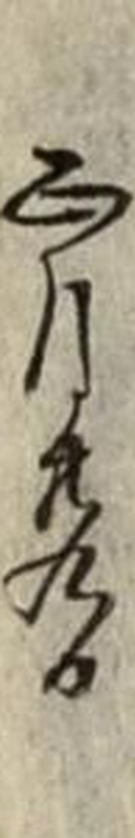正月廿九日
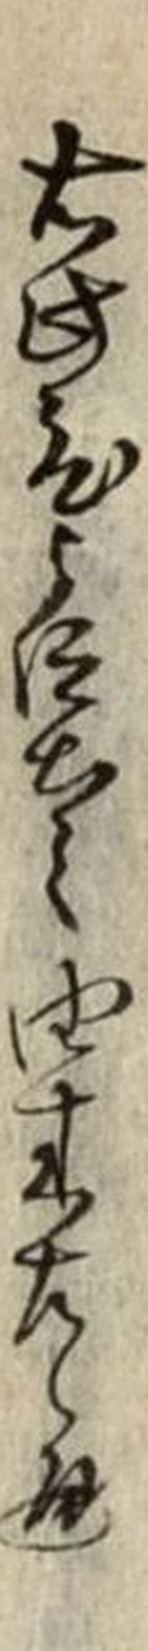右此度被仰出之由来左之通
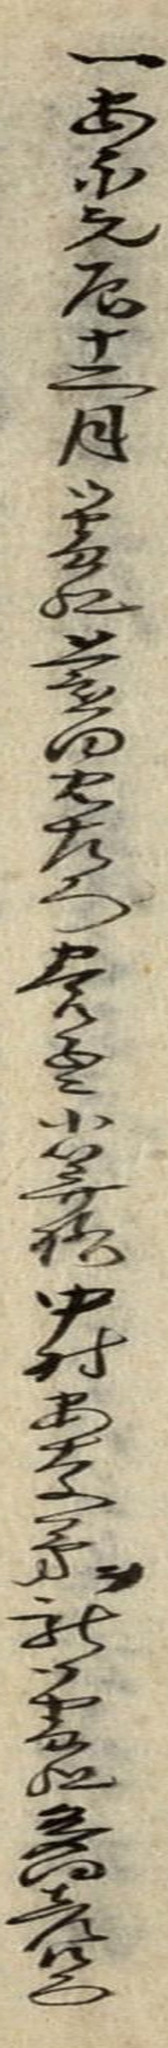一安永元辰十二月御番組遠田忠左衛門養子ニ小算格中村安太夫弟ヲ新御番組多田彦左衛門
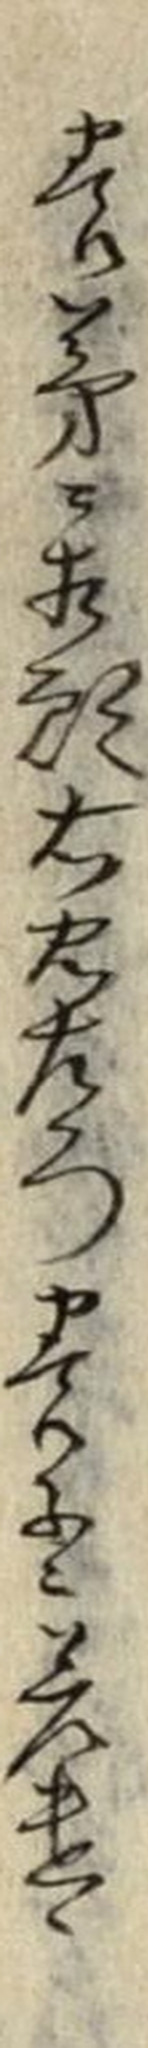養弟ニ相願右忠左衛門養子ニ差遣候
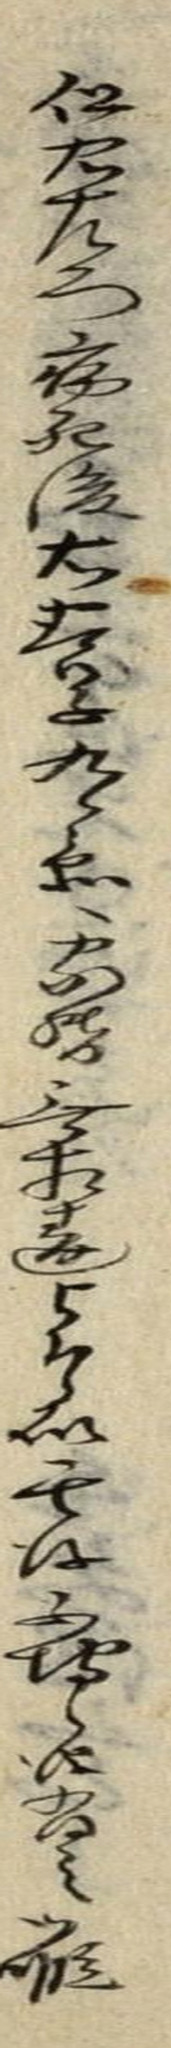但忠左衛門病死後右養子九郎兵衛へ家督無相違被下候処其後不埒之儀有之御暇
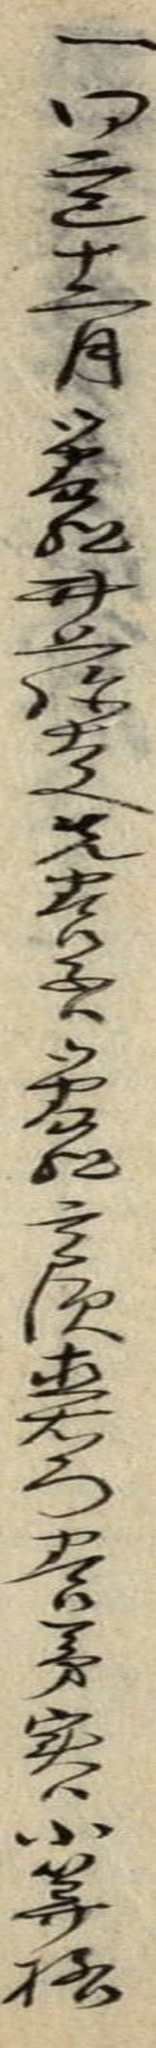一同二巳十二月御番組井上弥太夫先養子ハ御番組高須直右衛門養弟実ハ小算格
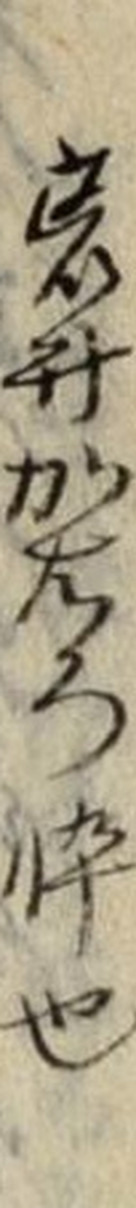荒井加左衛門忰也
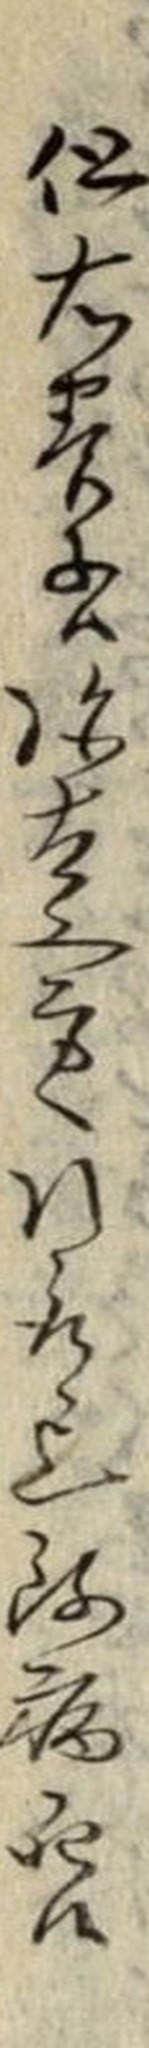但右養子ハ弥太夫方へ引取候上致病死候
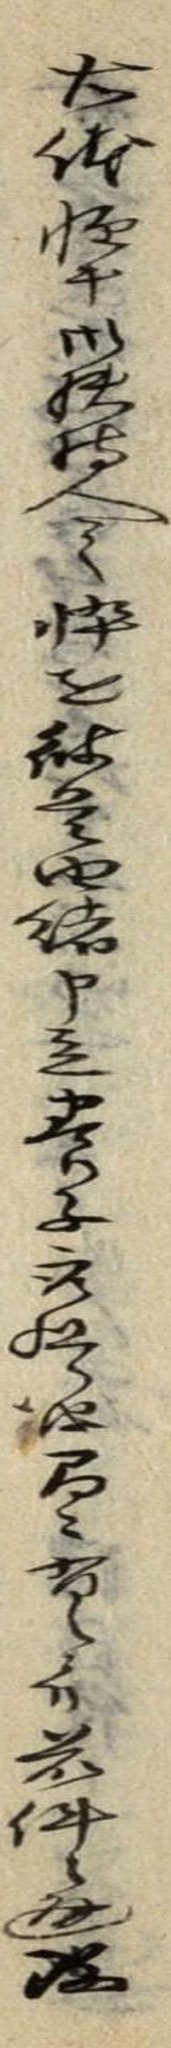右体軽キ御扶持人之忰を彼是由緒申立養子取組候儀間々有之ニ付前件之通改
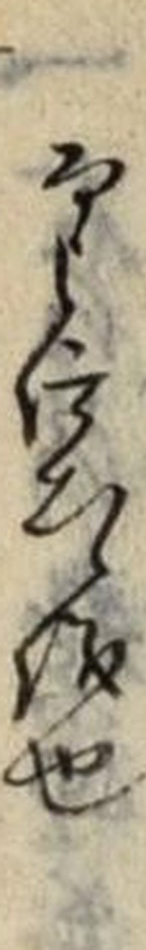而被仰出候趣也
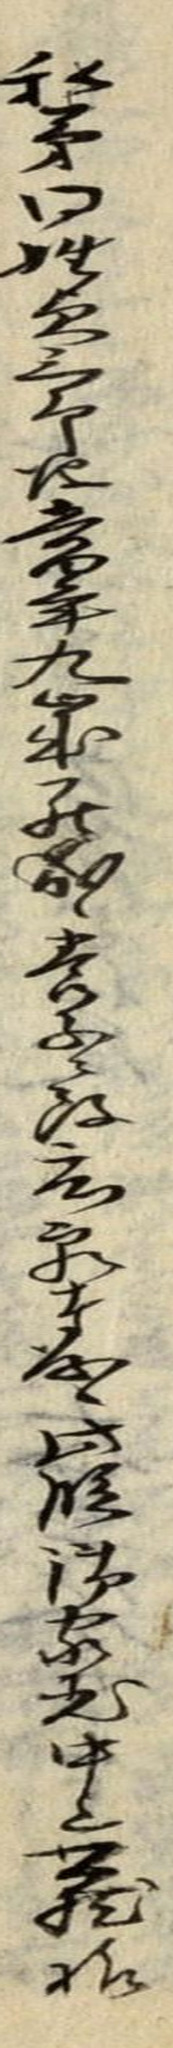私弟同姓貞三郎儀当年九歳罷成候養子ニ致度願奉存候此段御家老中迄可然様
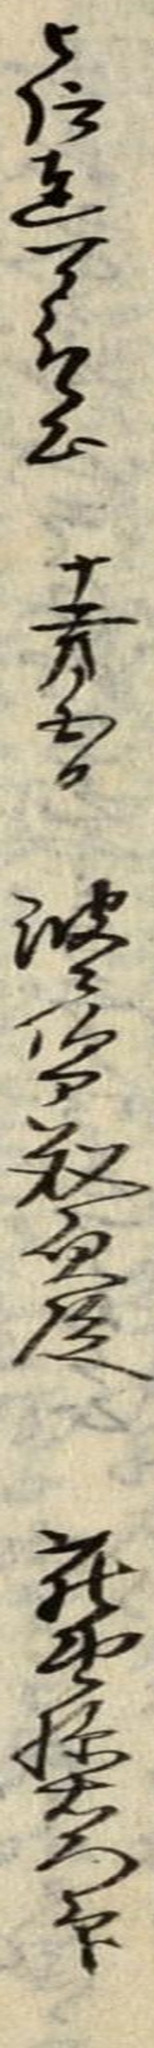被仰達可被下候以上十二月五日波々伯部靱負殿荻野孫右衛門印
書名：養子縁組之部
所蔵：福井県文書館 Fukui Prefectural Archives
